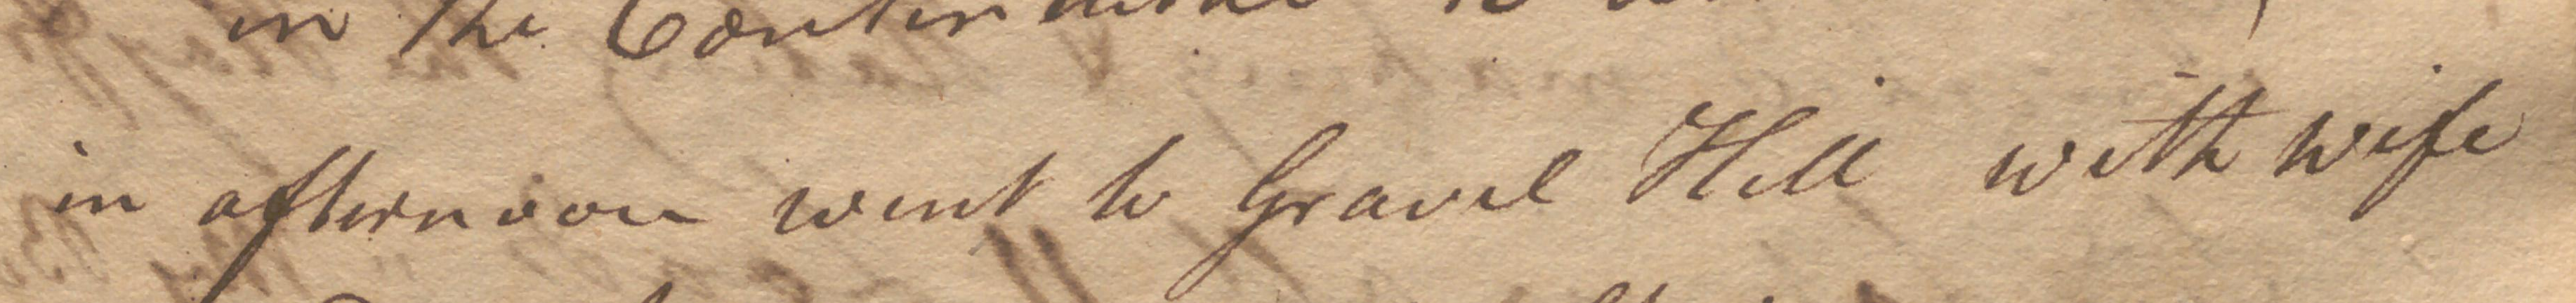in afternoon went to Gravel Hill with wife
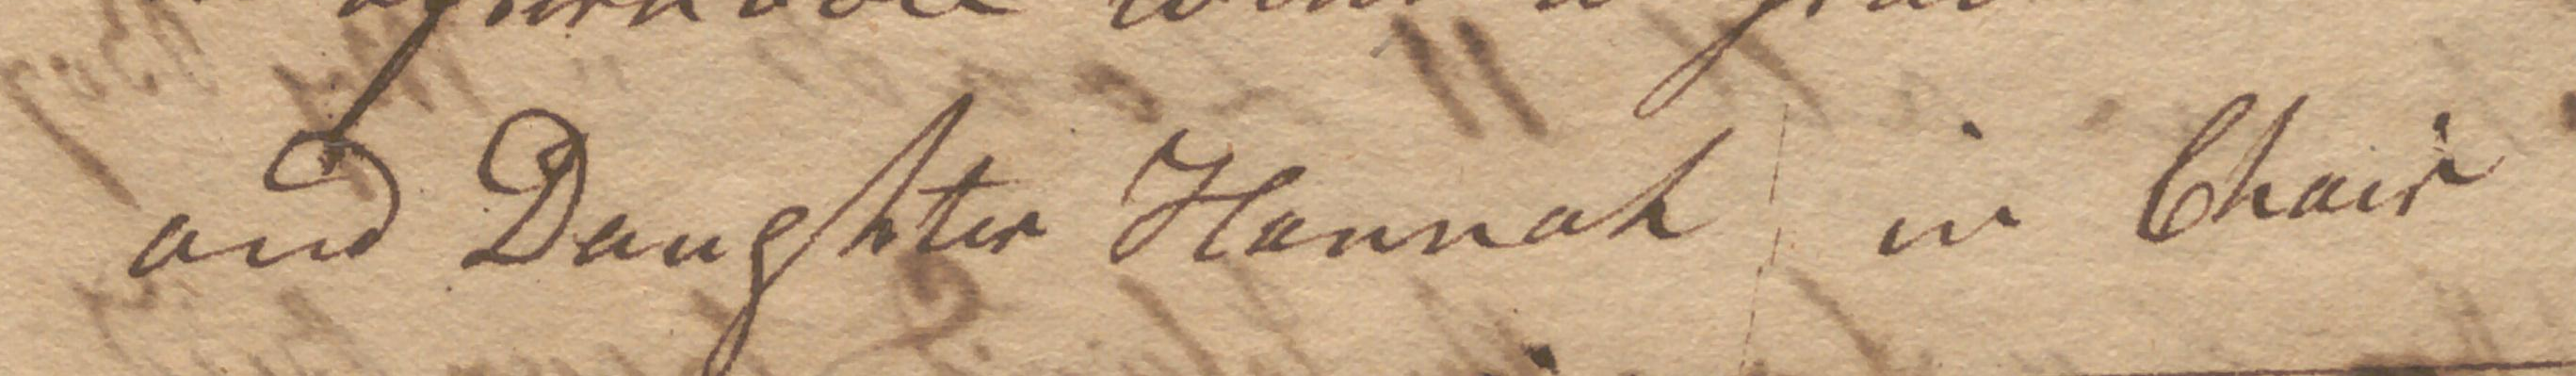and Daughter Hannah in Chair
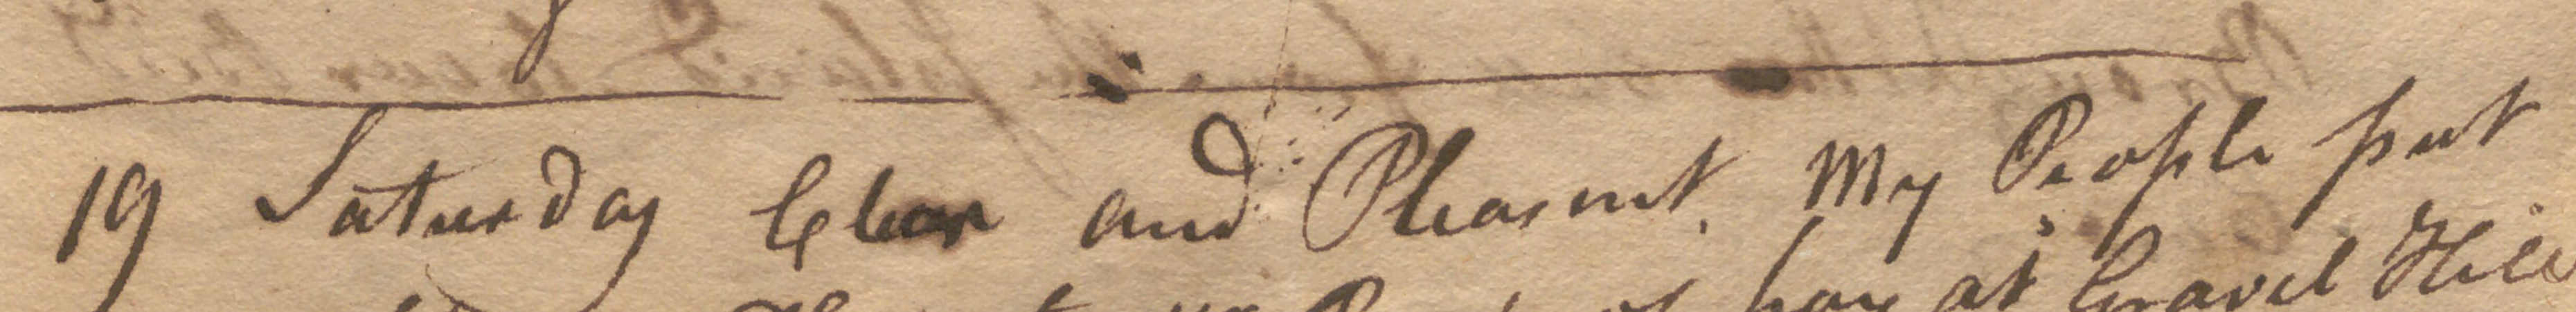19 Saturday Clear and Pleasent, My People put
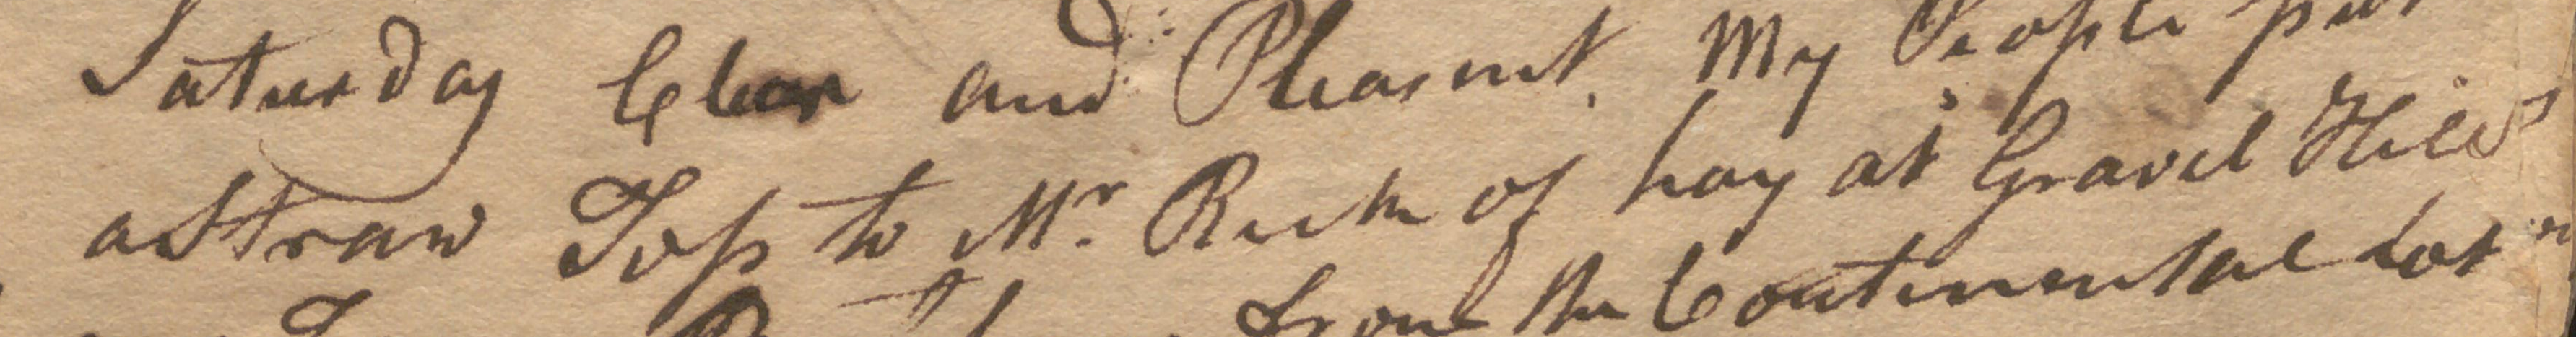a Straw Top to M^r. Rich of hay at Gravel Hill
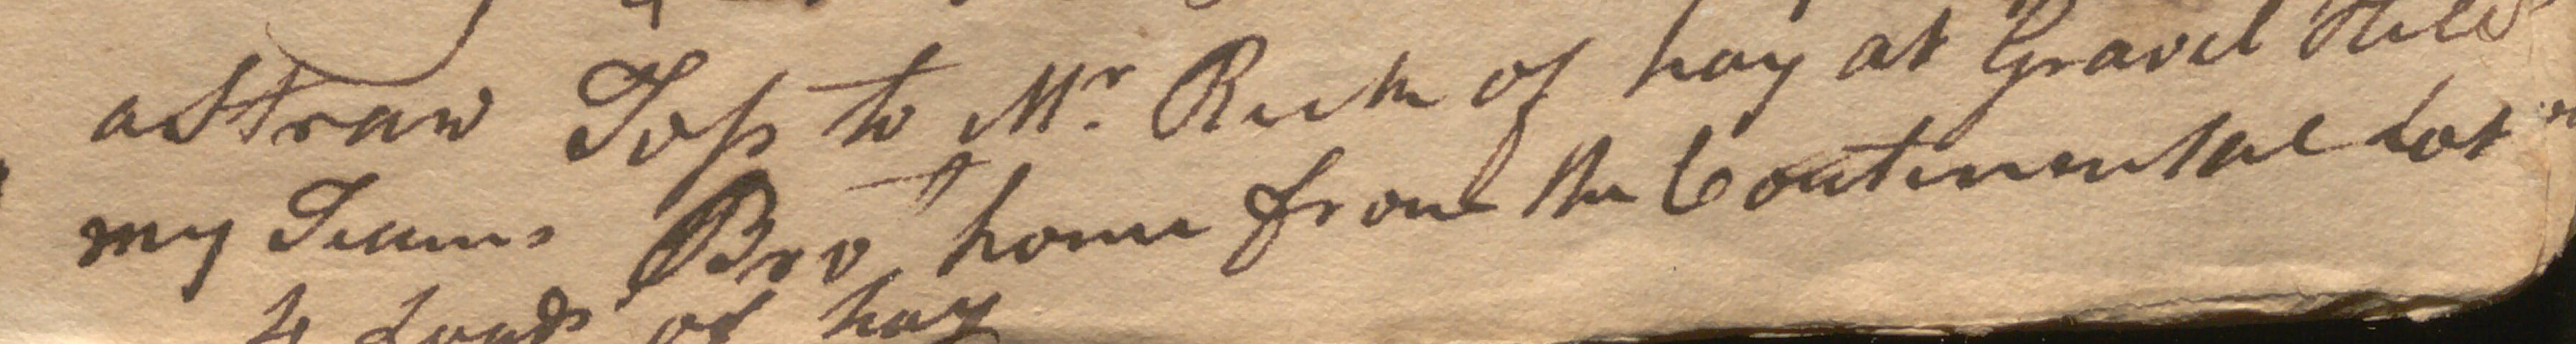my Teams Bro^t home from the Coutinental Lot
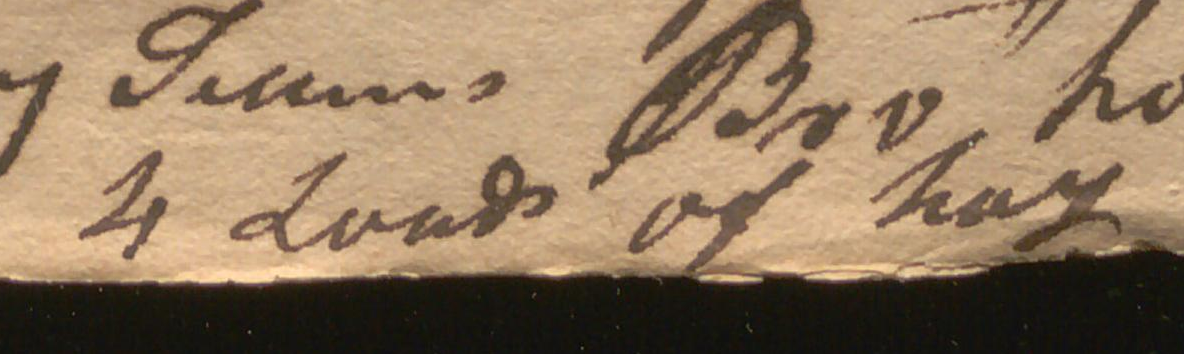4 Loads of hay
